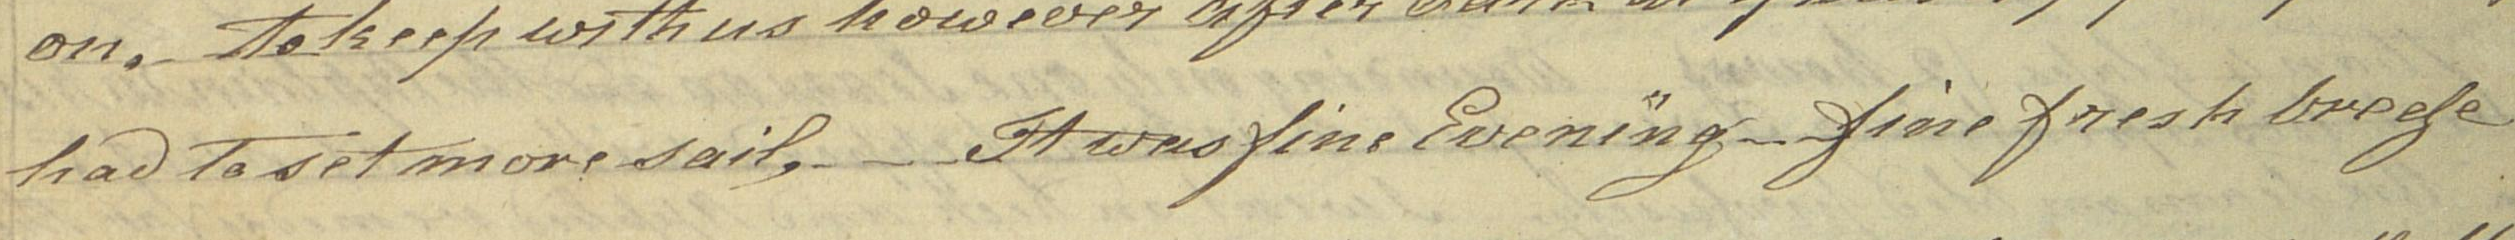had to set more sail, It was fine Evening fine fresh breeze
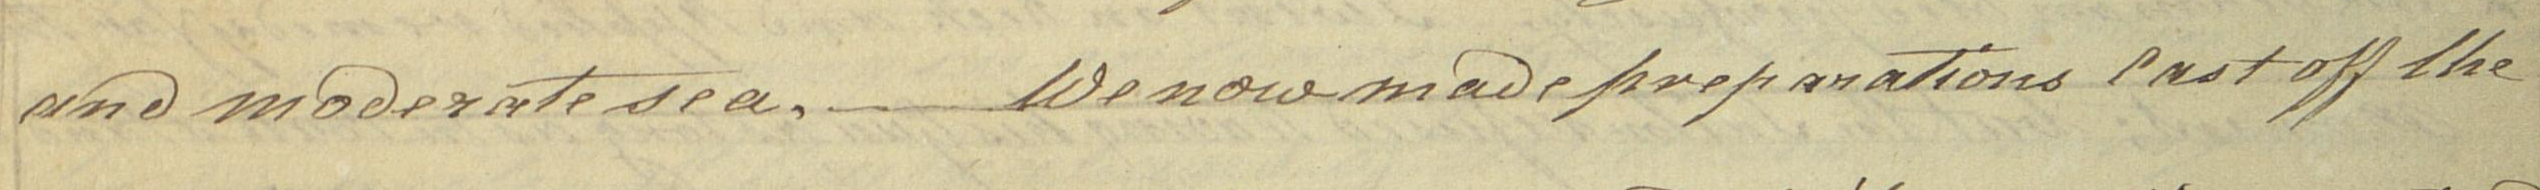and moderate sea. We now made preparations cast off the
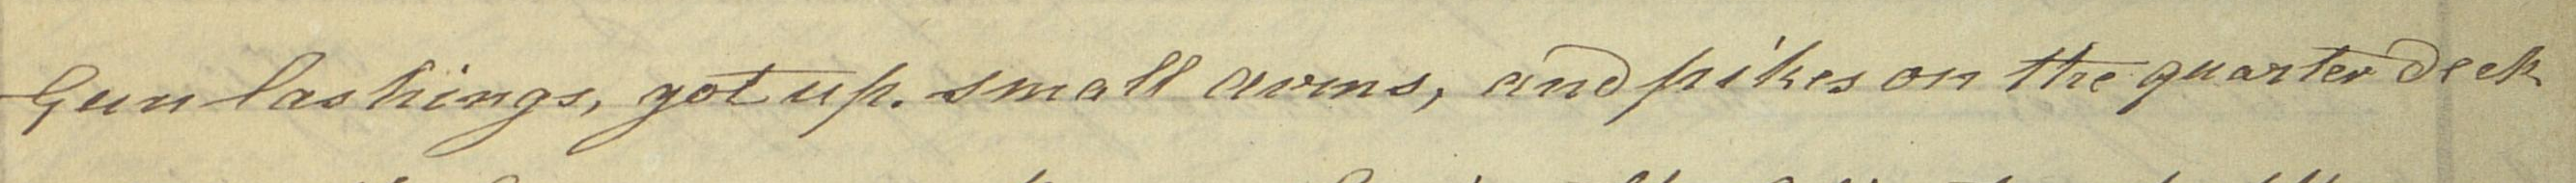Gun lashings got up small arms, and pikes on the quarter deck
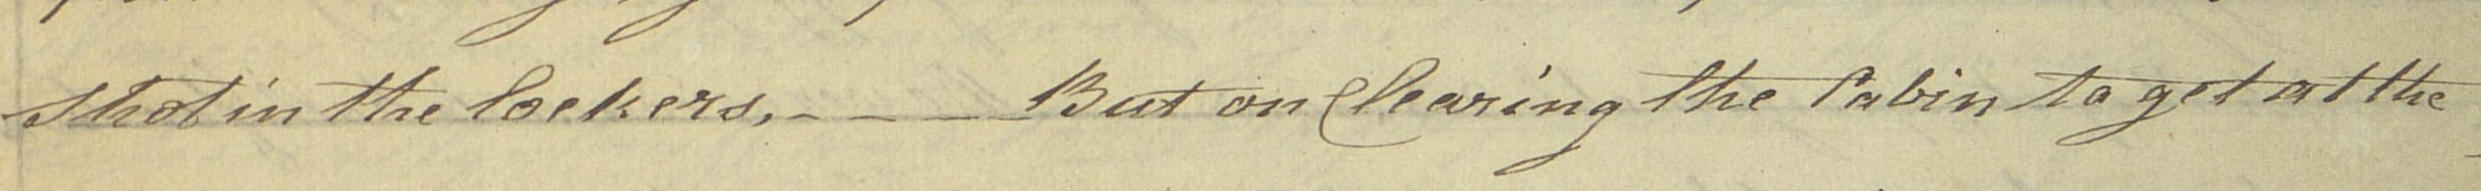Shot in the lockers, But on Clearing the Cabin to get at the
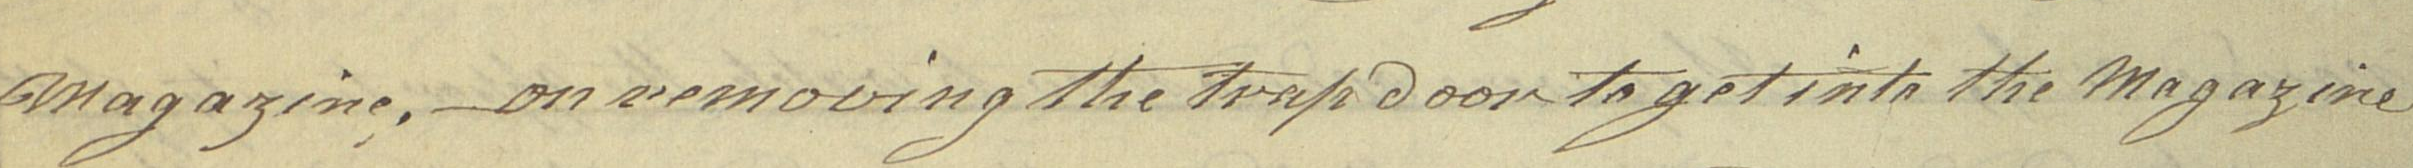Magazine,- on removing the trap door to get into the Magazine
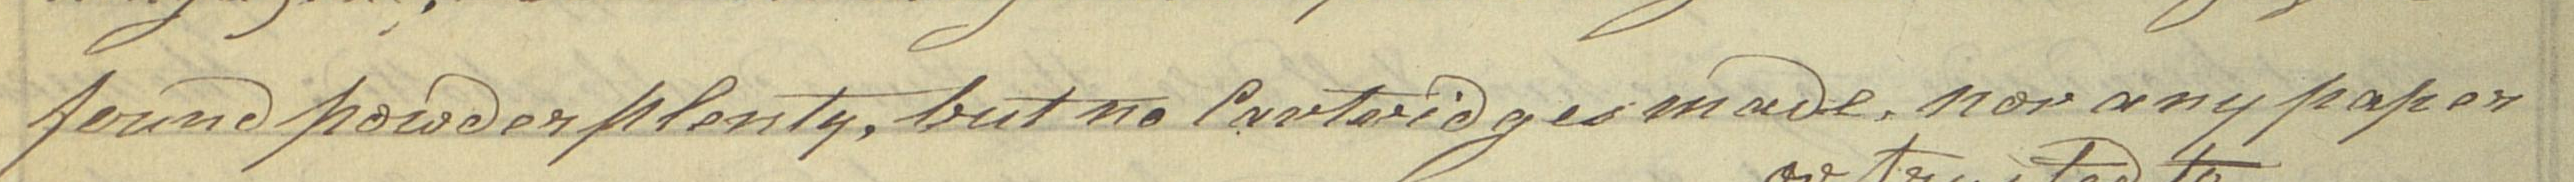found powder plenty, but no cartridges made nor any paper
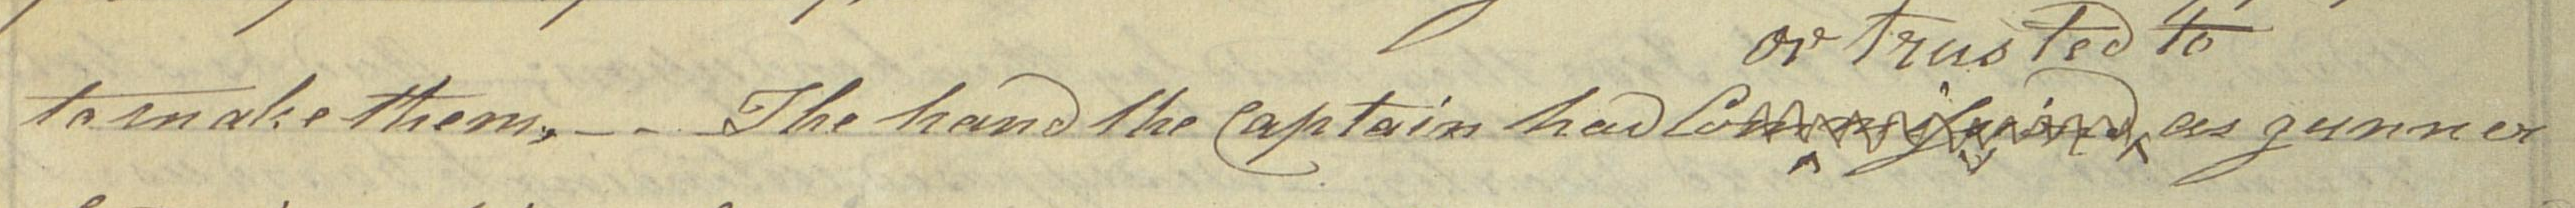to make them, The hand the Captain had Commissioned ^ as gunner
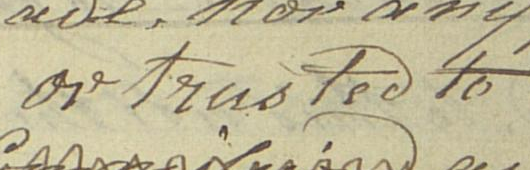or trusted to
